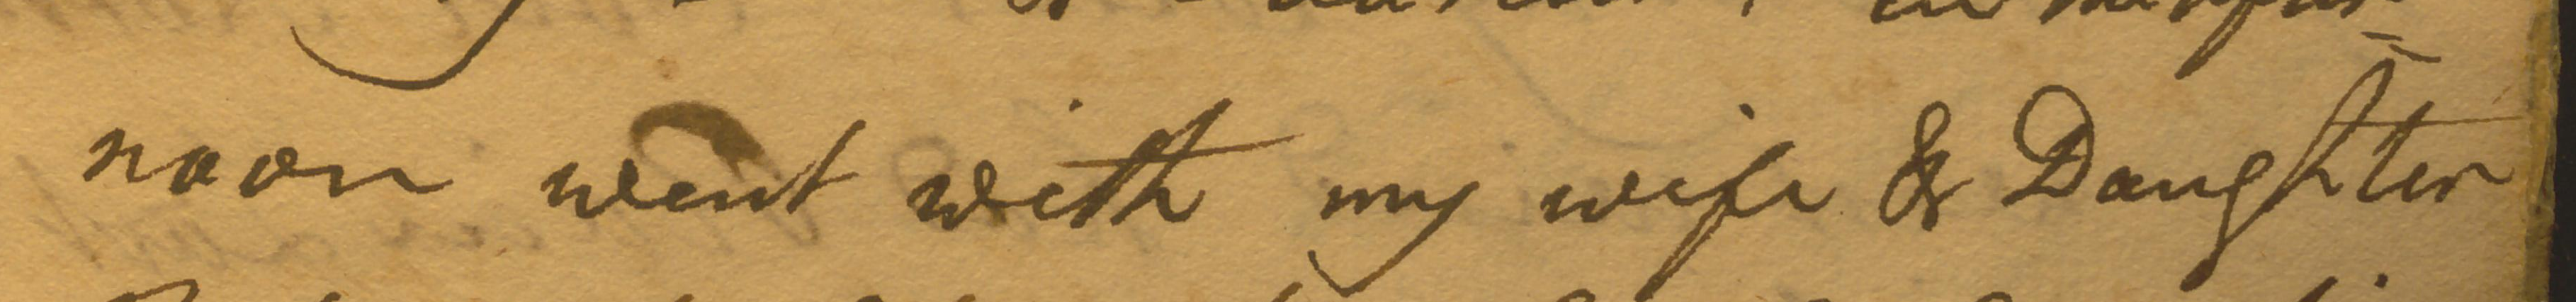noon went with my wife & Daughter
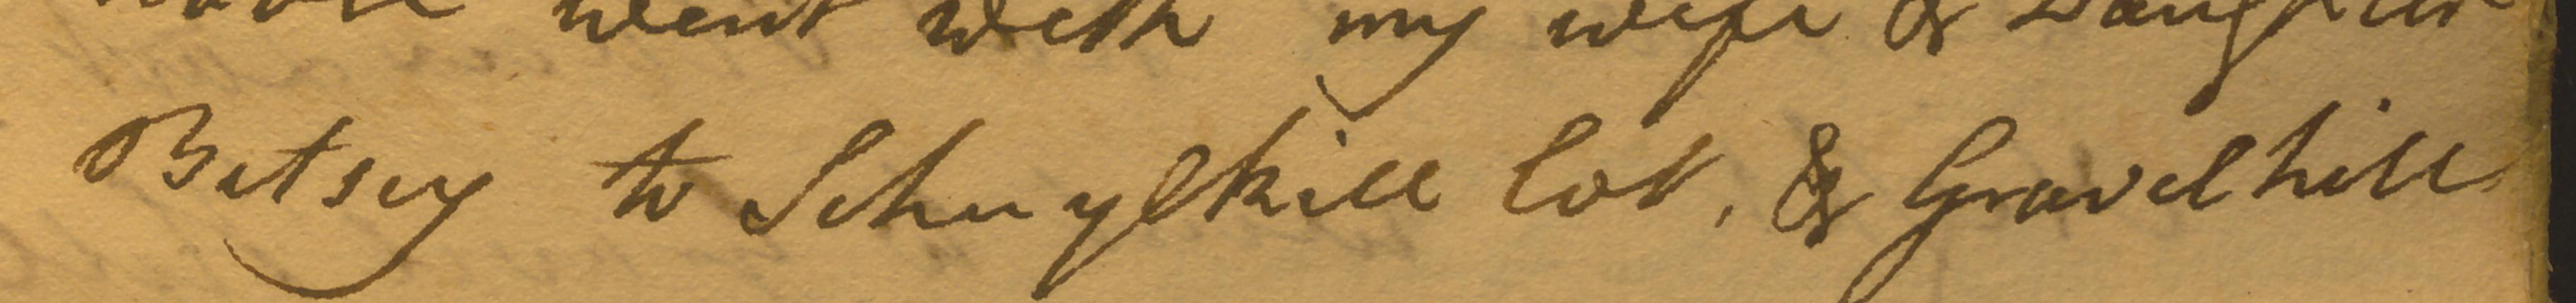Betsey to Schuylkill Col. & Gravelhill
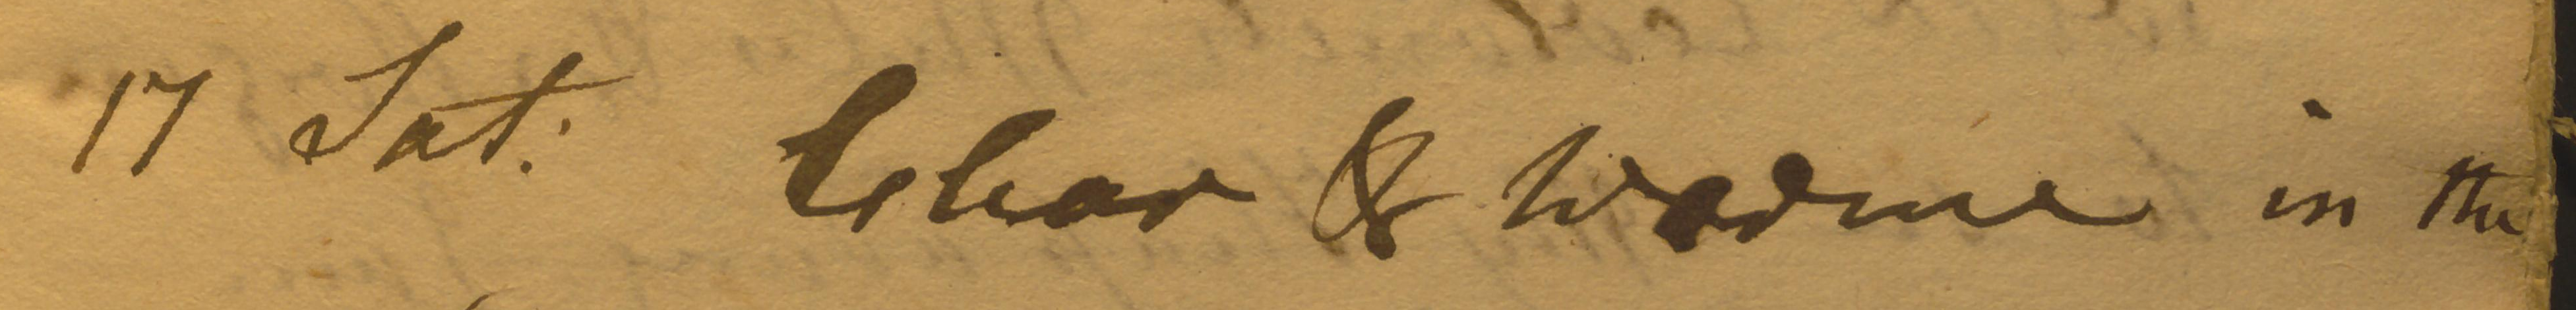17 Sat: Clear & warme in the
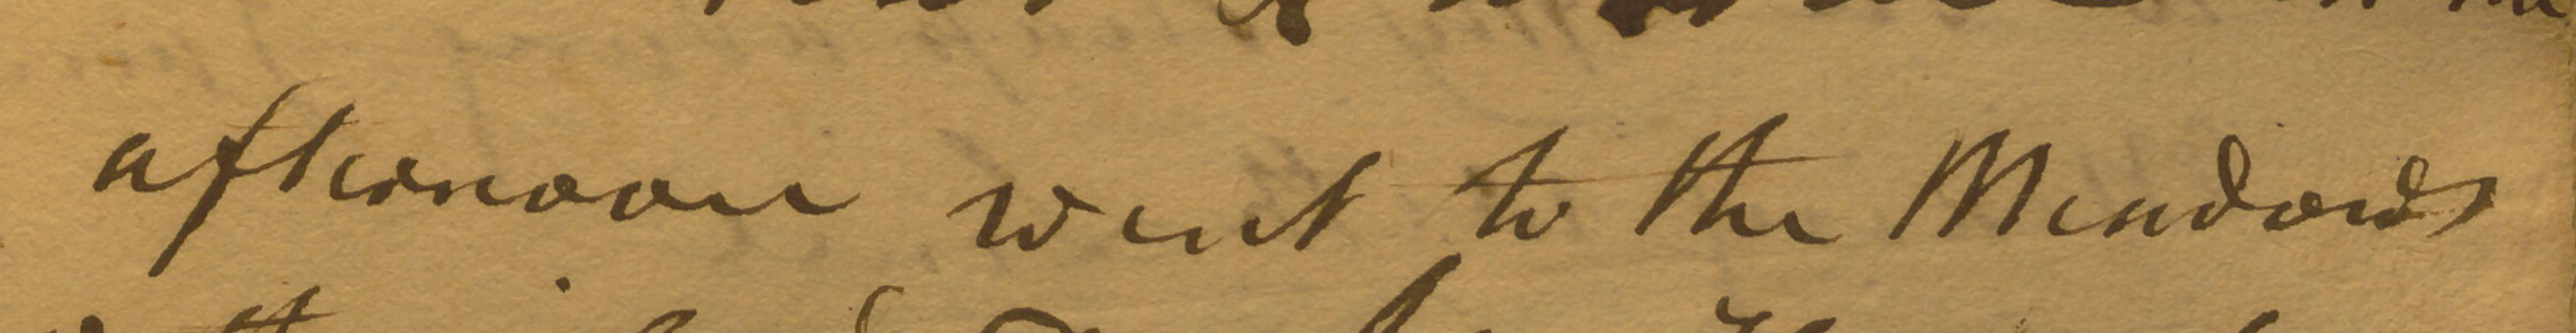afternoon went to the Mendows
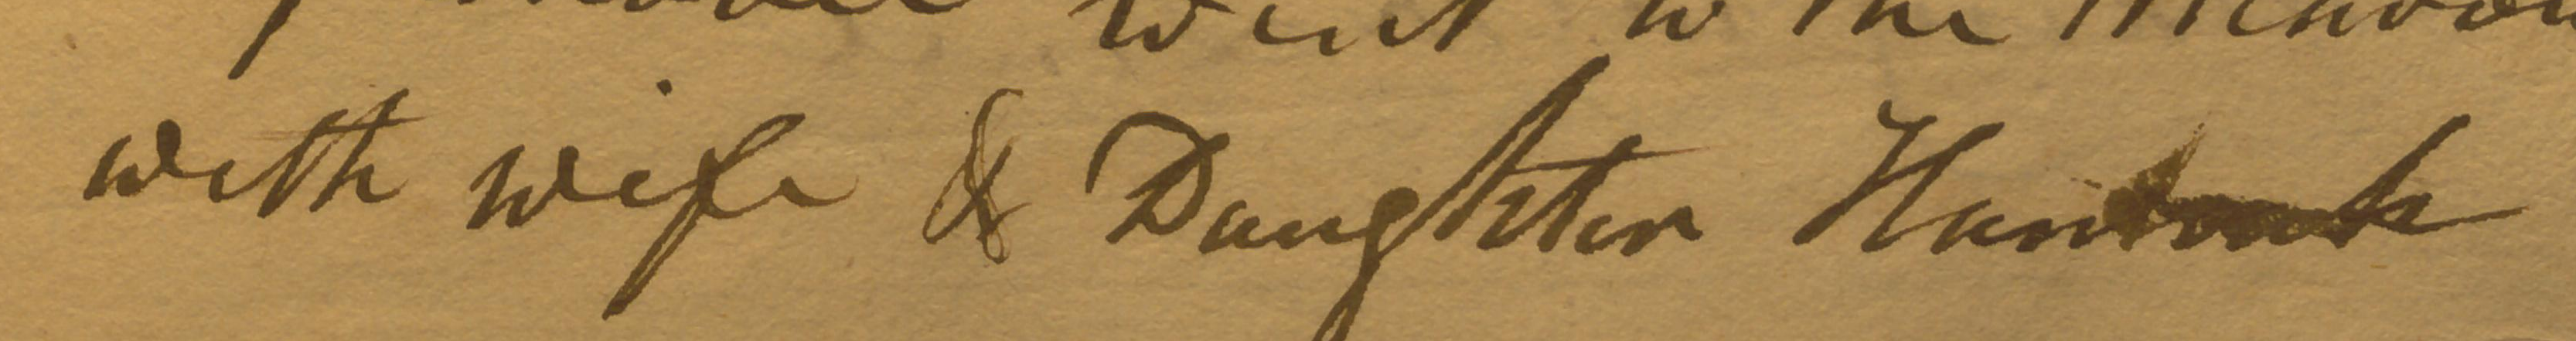with wife & Daughter Hannah
